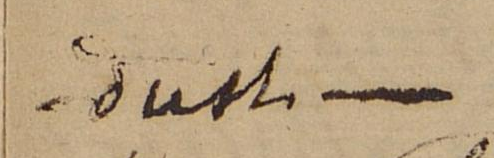-dust -
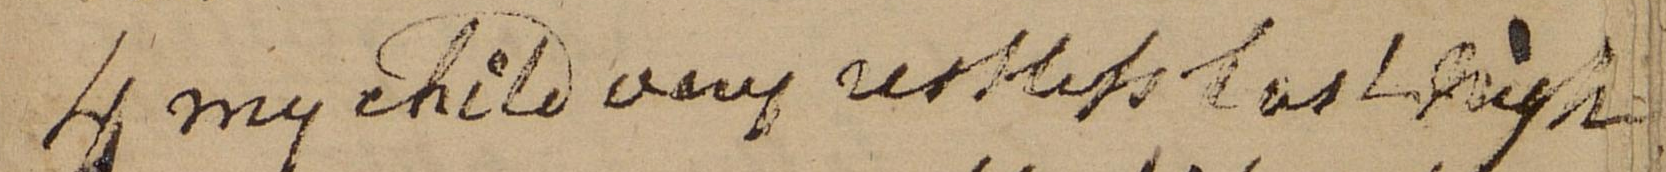4 my child very restless last nigh
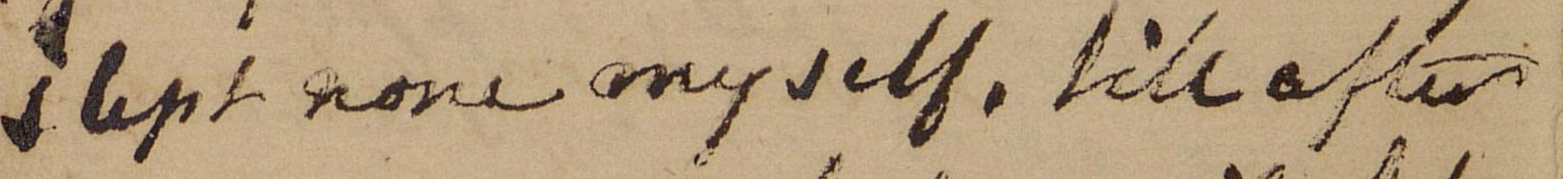slept none myself, till after
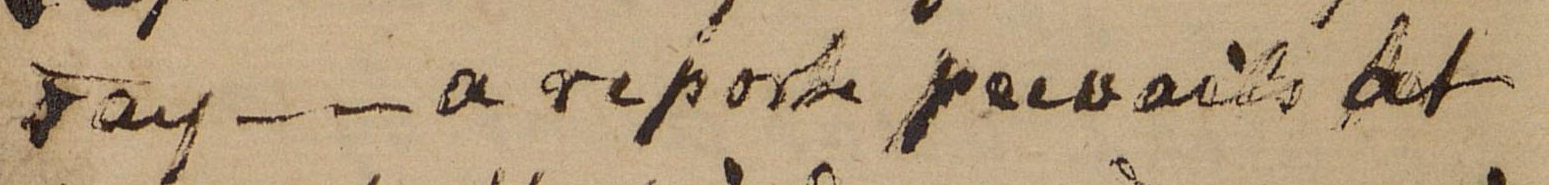day-- & report prevails at
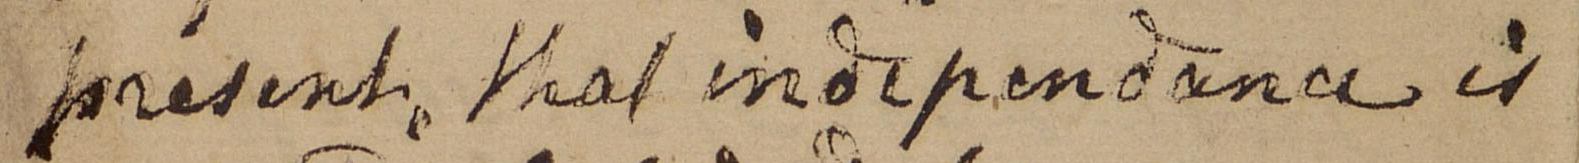present, that independance is
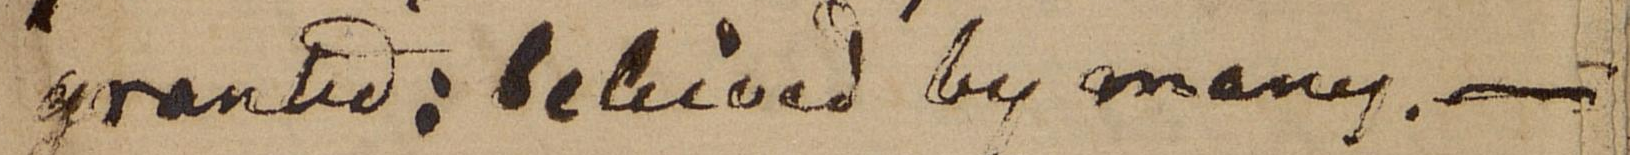granted; beleived by many-
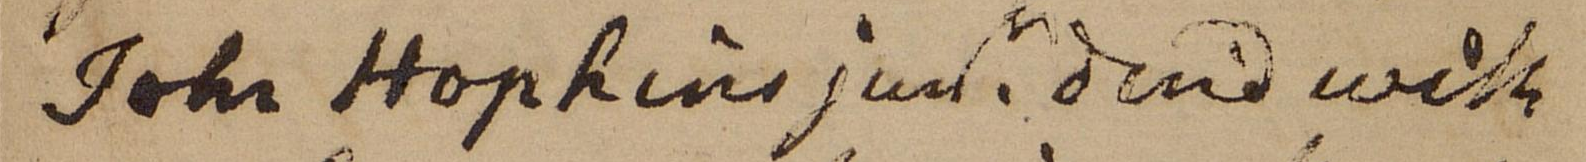John Hopkins jun^r. din'd with
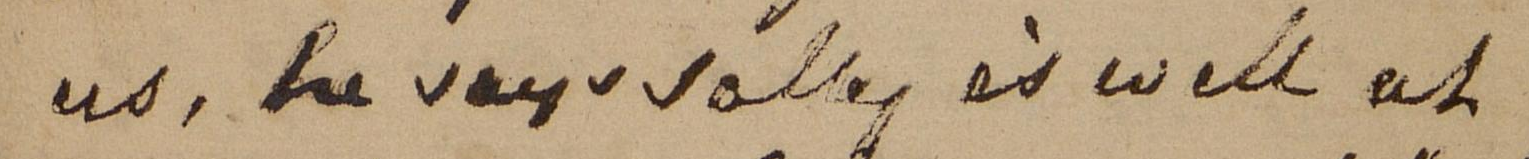us, be says Sally is well at
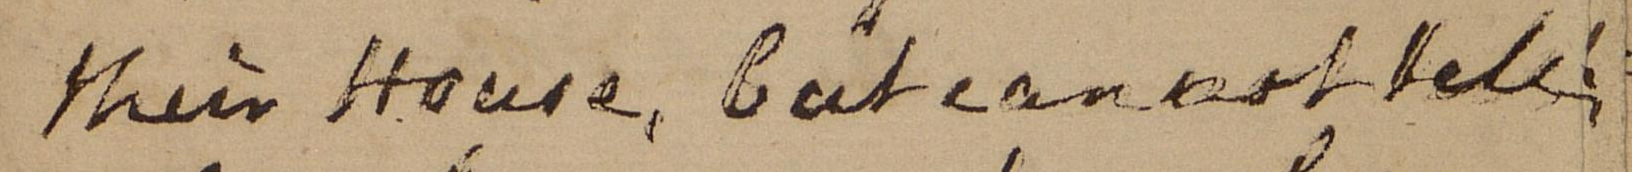their House, but cannot tell
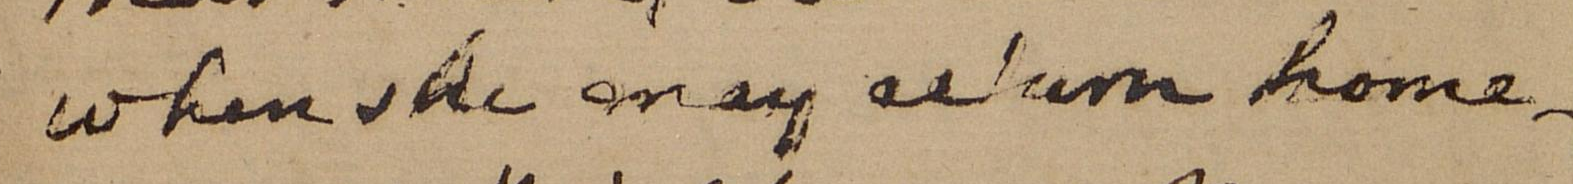when she may return home-
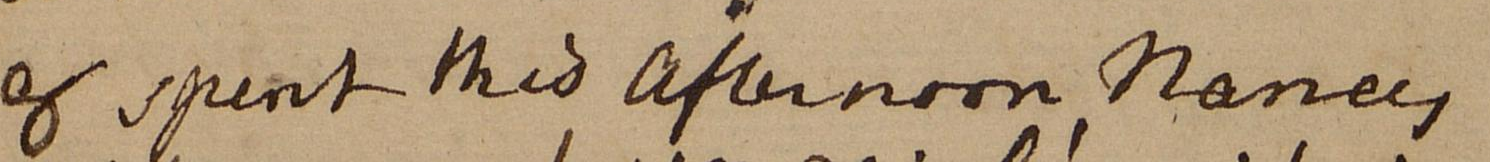& spent this Afternoon, Nancy
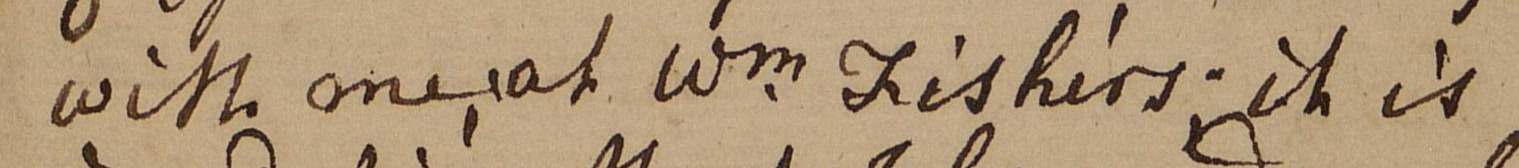with me at W^m Fisher's it is
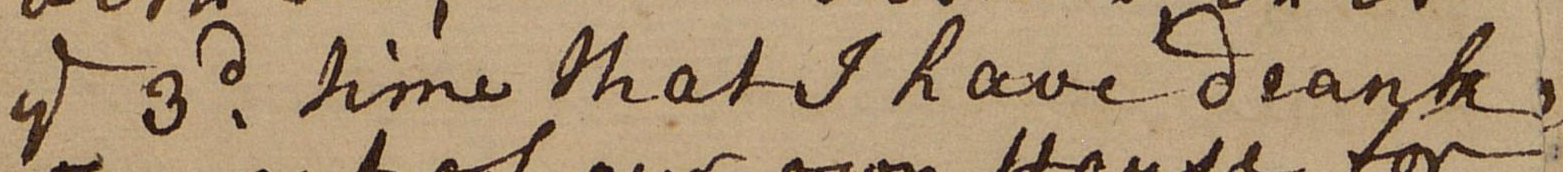y^e 3^d. time that I have drank
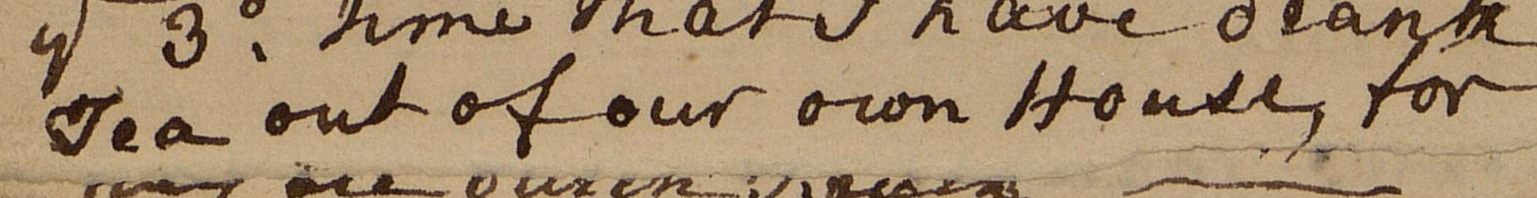Tea out of our own House, for
